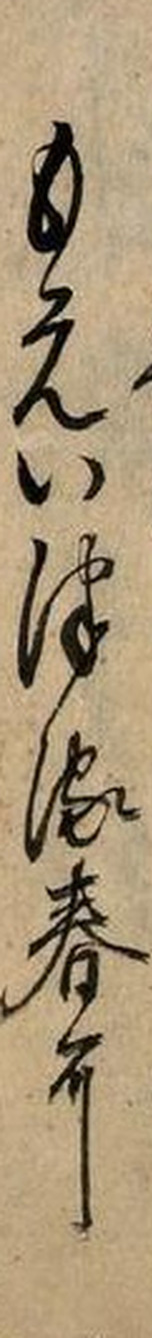もえいつる春に
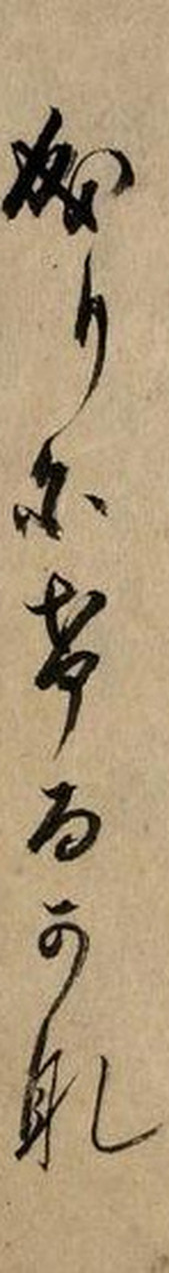成りにけるかな
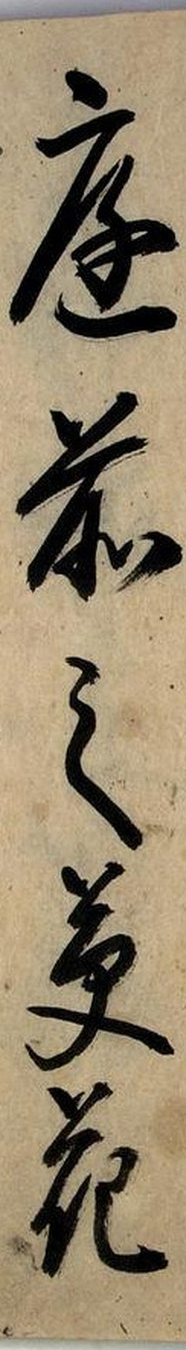庭前之美花
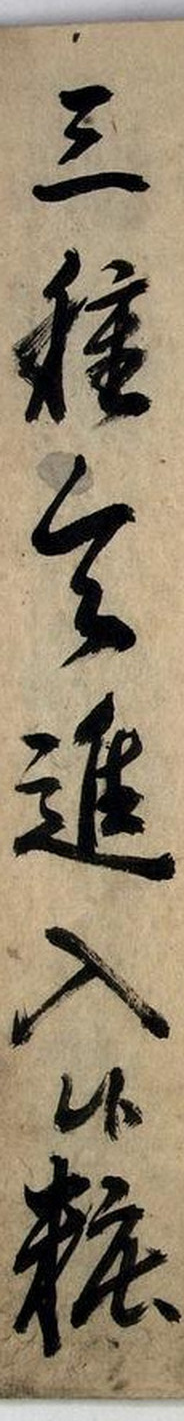三種言進入候粧

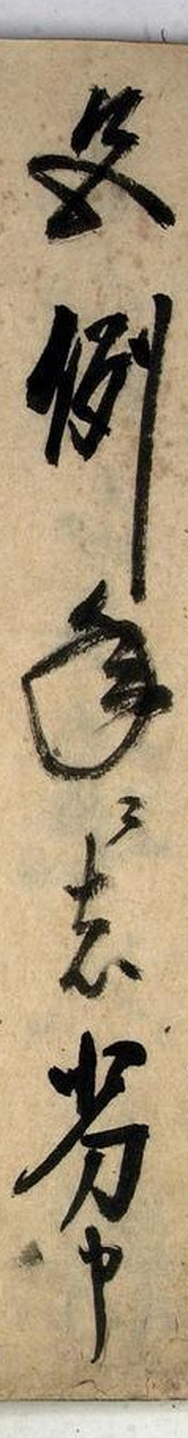色例年ニ者劣申
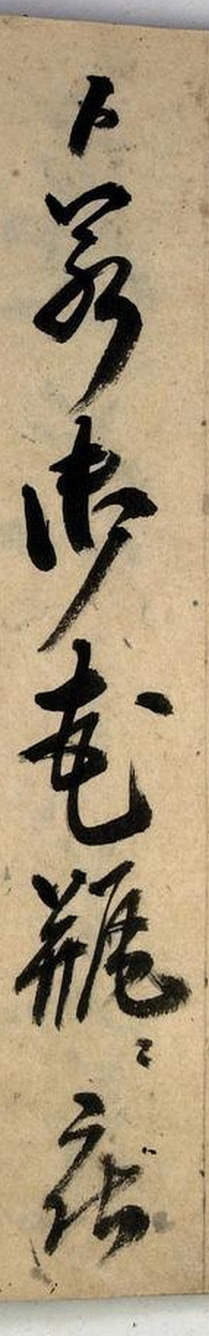候若御花瓶ニ被
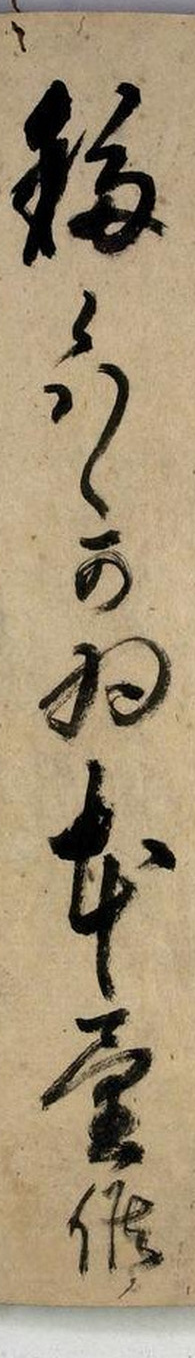移候ハゝ可為本望候
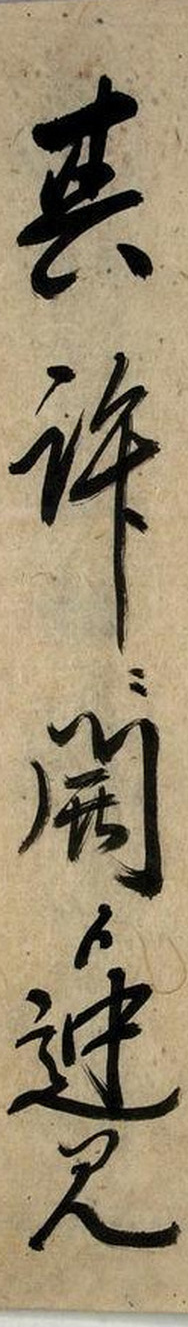其許ニ開候迚見
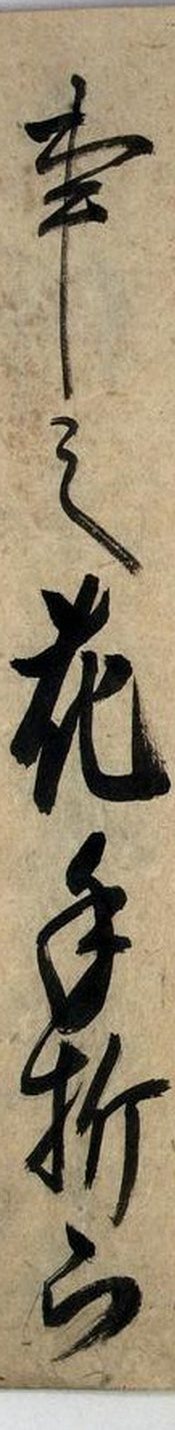事之花手折被

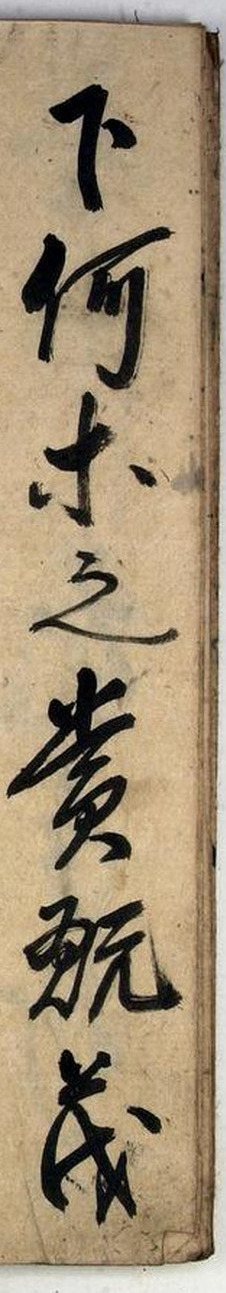下何等之賞翫も
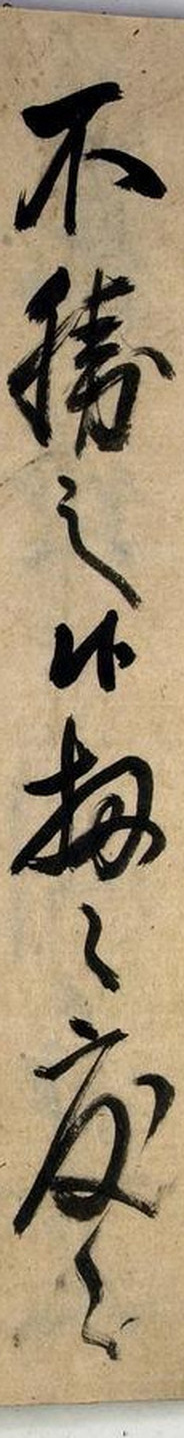不勝之候扨々度々
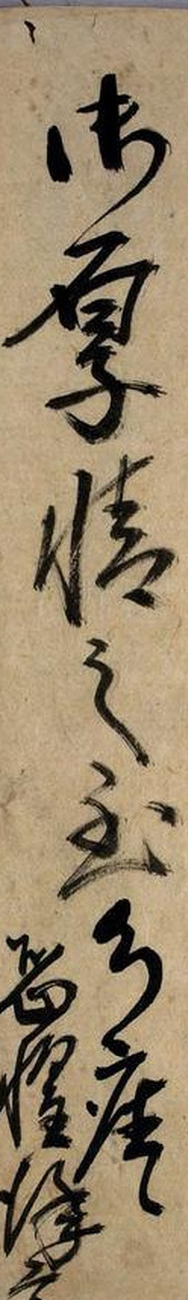御厚情之至御座候
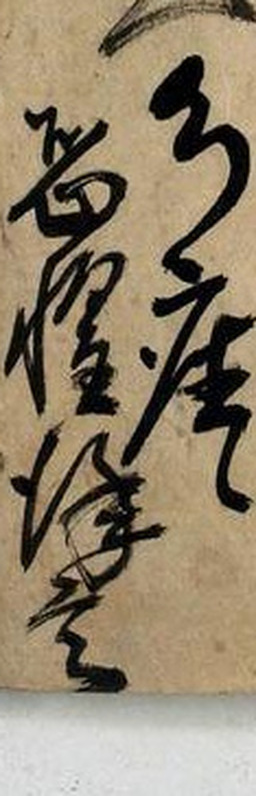恐惶謹言
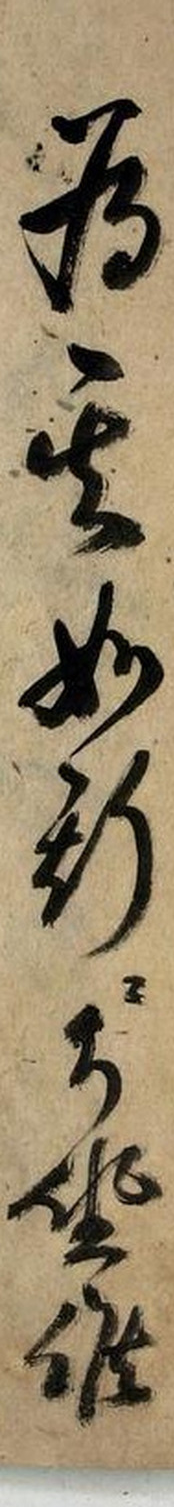為其如斯ニ御座候
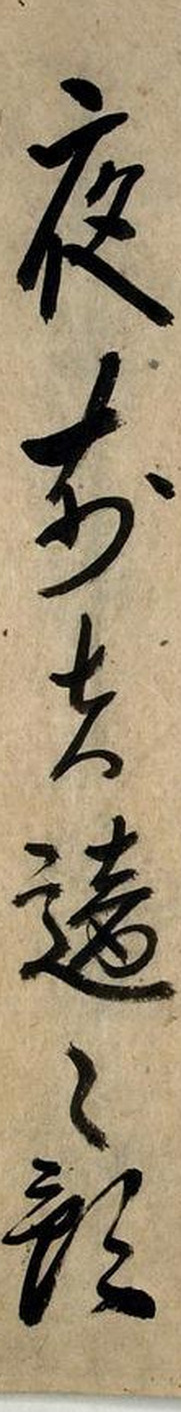夜前者適々預
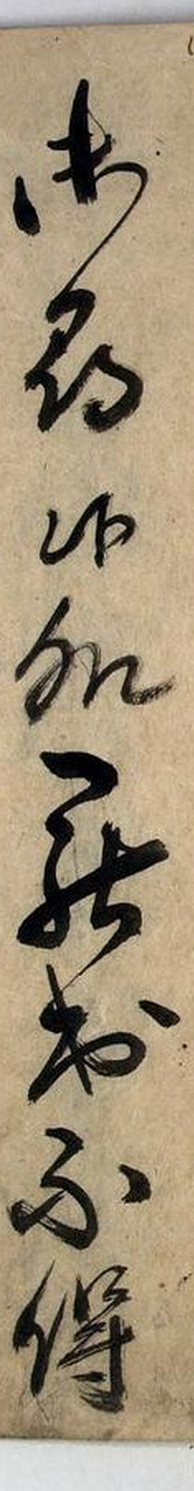御尋候処罷出不得
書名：御手本（手習、小川浦大網に鯨掛り生捕候由ニ付）
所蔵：福井県文書館 Fukui Prefectural Archives
